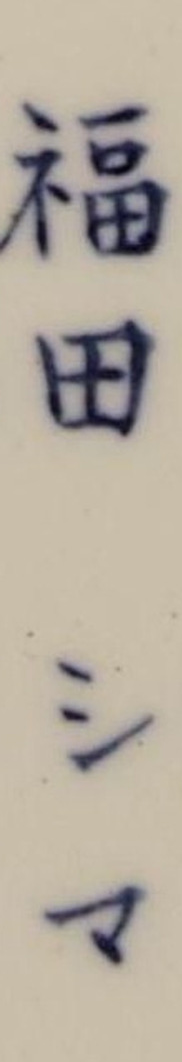福田シマ
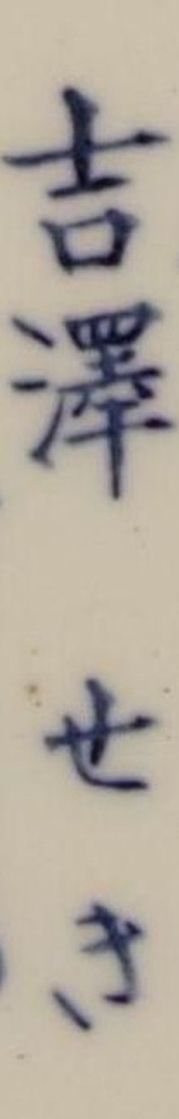吉沢せき
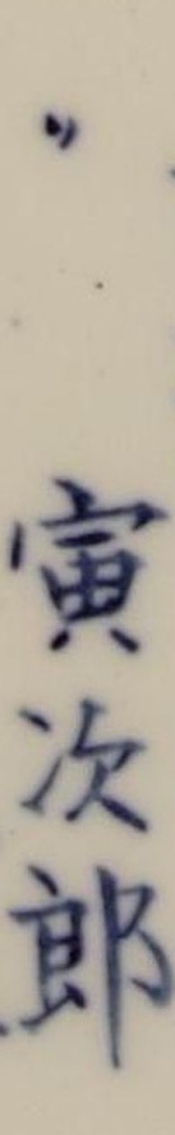寅次郎
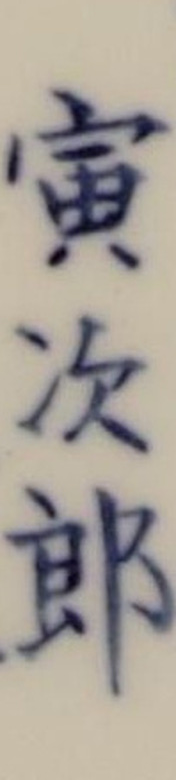寅次郎
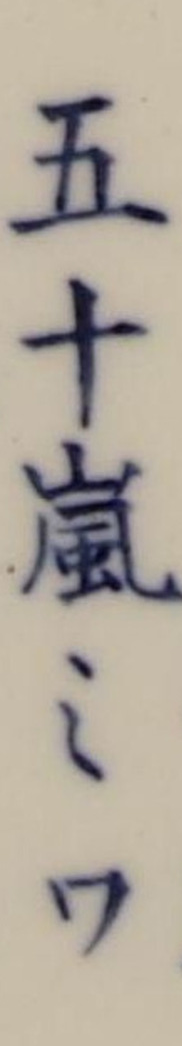五十嵐ミワ
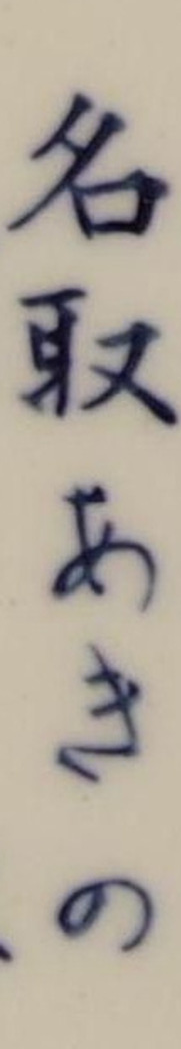名取あきの
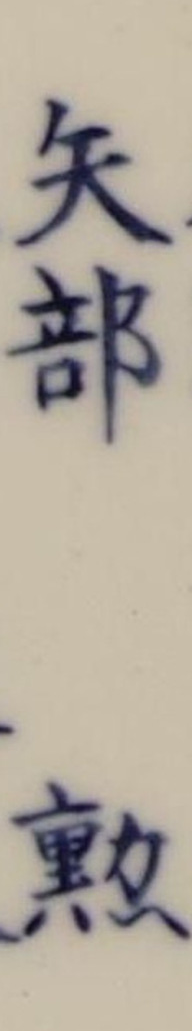矢部勲
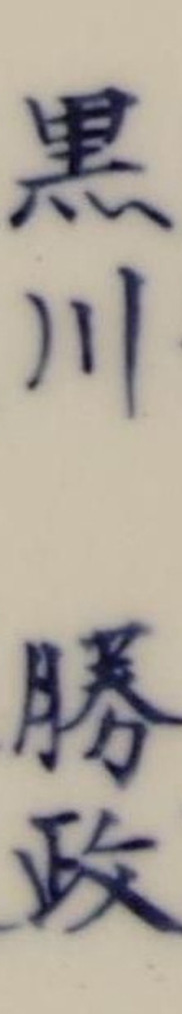黒川勝政
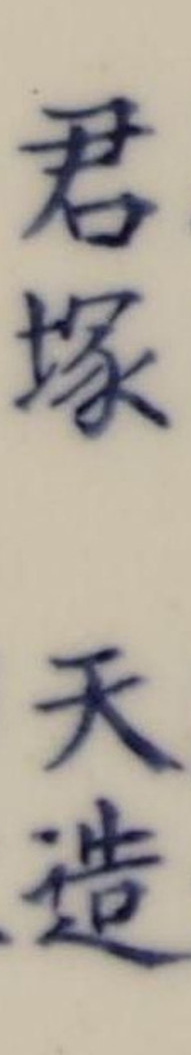君塚天造

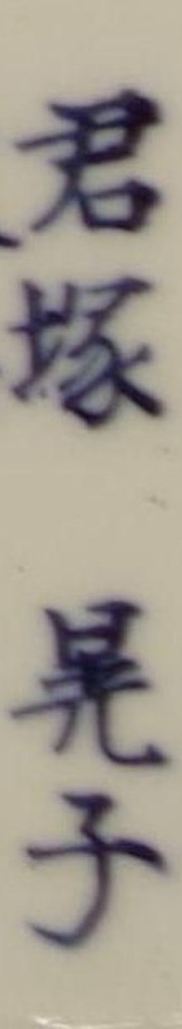君塚晃子
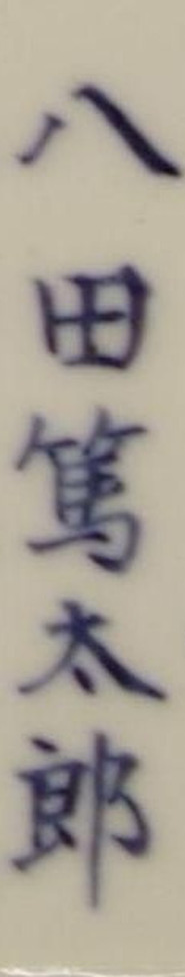八田篤太郎
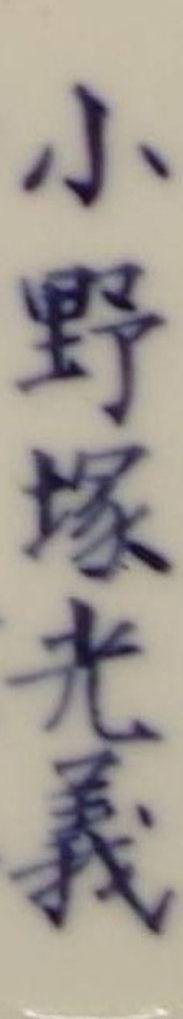小野塚光義
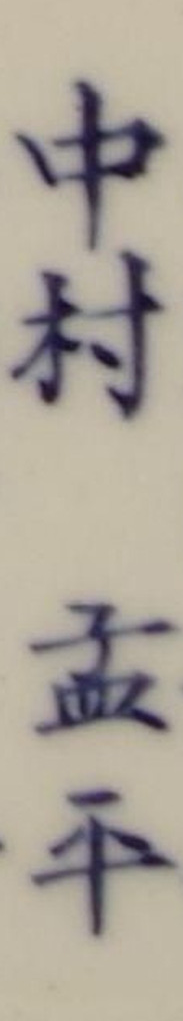中村孟平
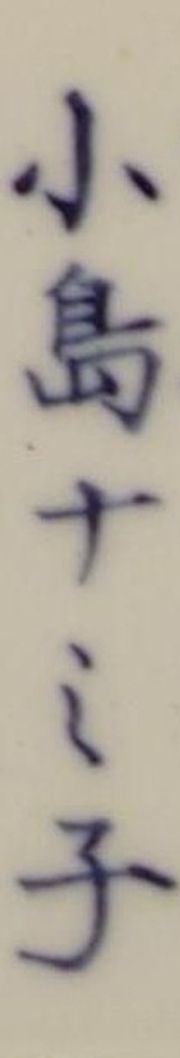小島ナミ子
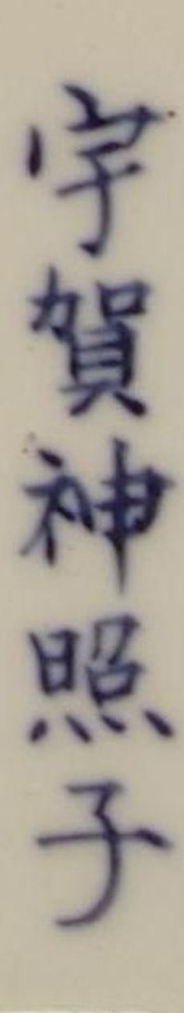宇賀神照子
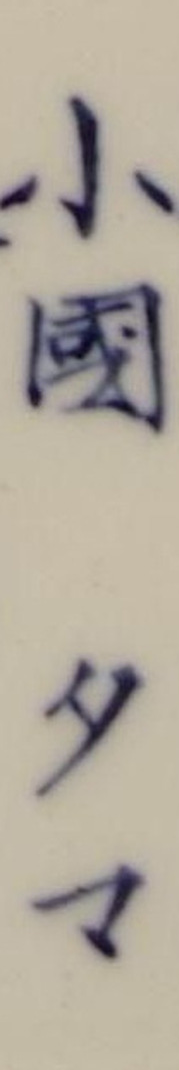小國タマ
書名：E~L
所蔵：高野山金剛峯寺
